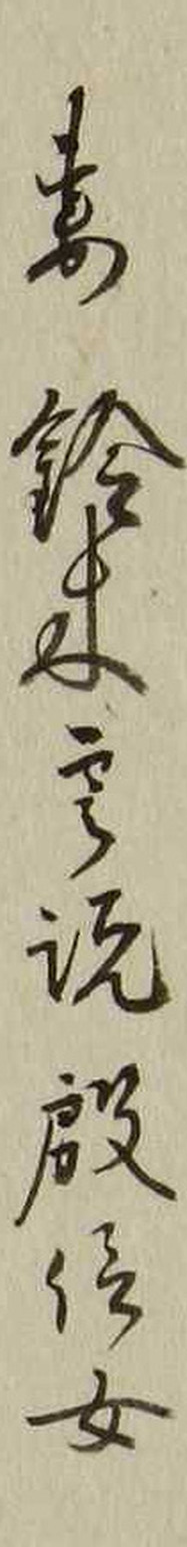妻鈴木雲説殷信女
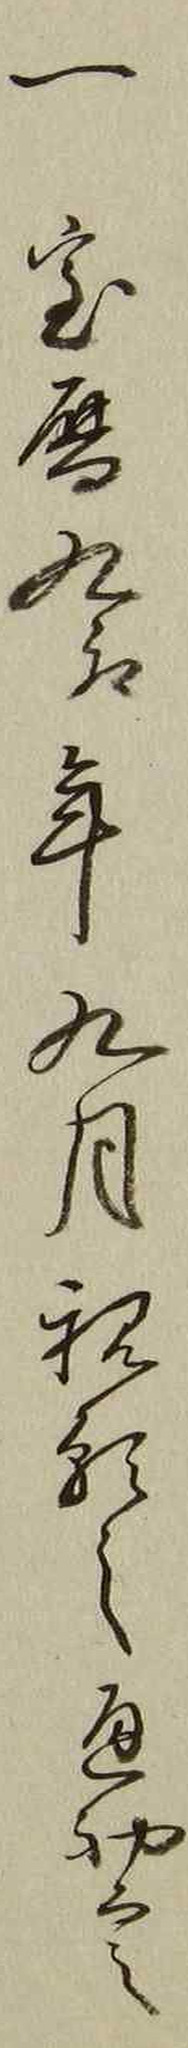一宝暦九卯年九月親願之通初而之
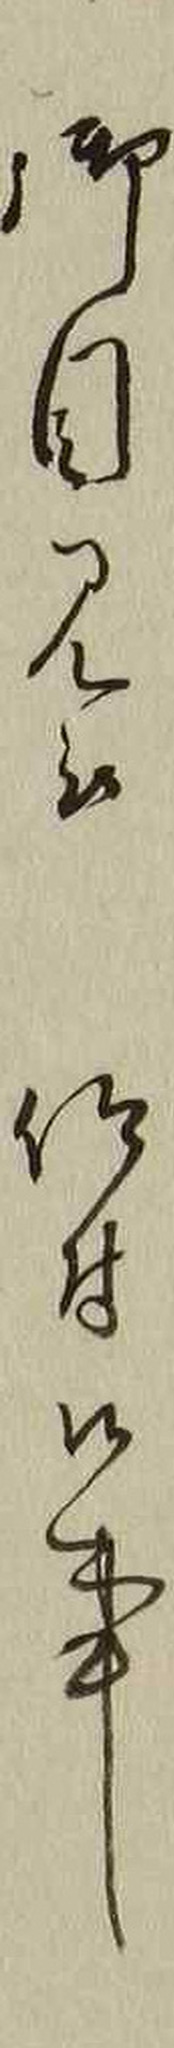御目見被仰付候事
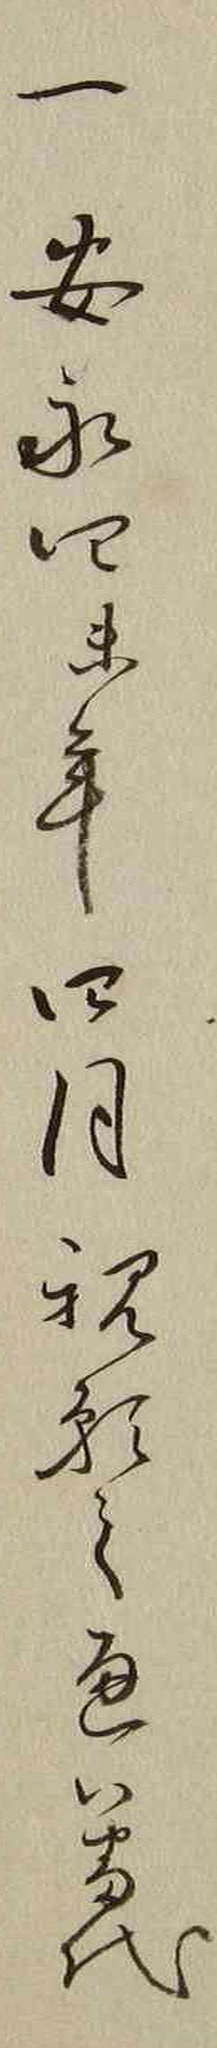一安永四未年四月親願之通御番代
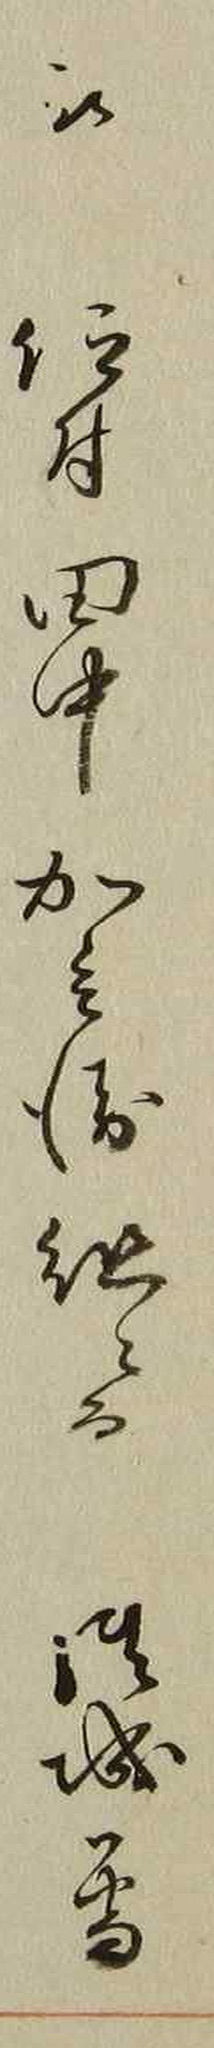被仰付田中加兵衛組に而御城御番
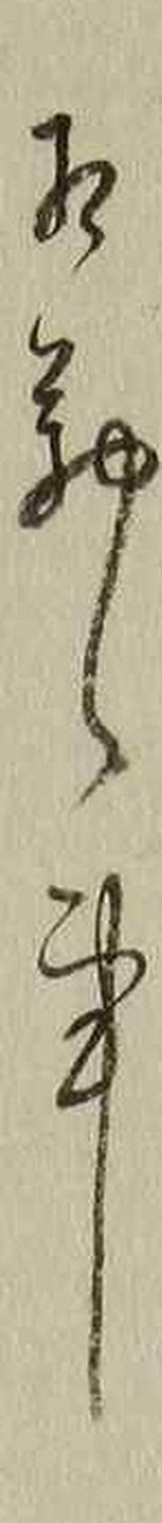相勤候事
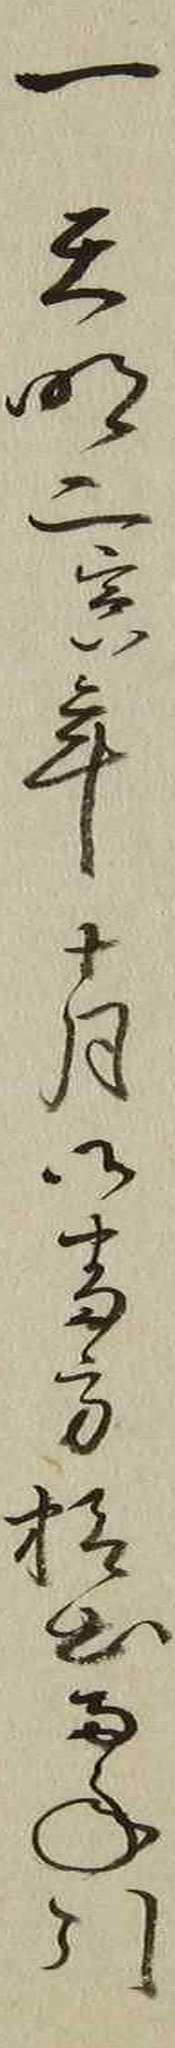一天明二寅年十月御番方精出両年引
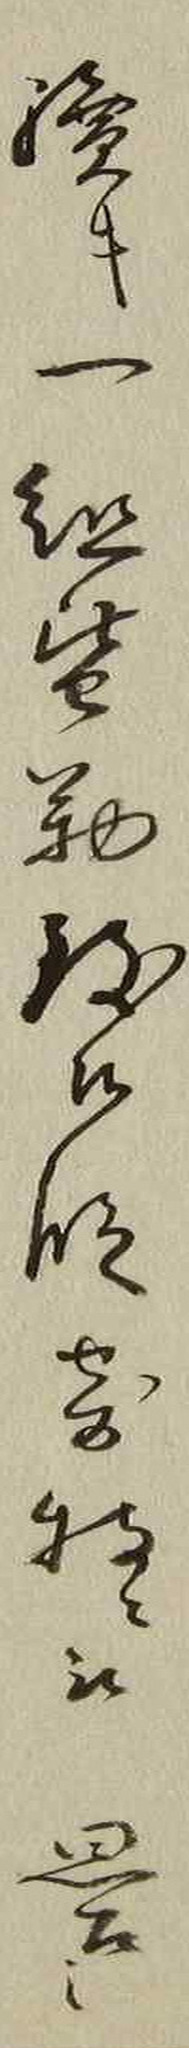続キ一組皆勤致候段奇特に被思召之
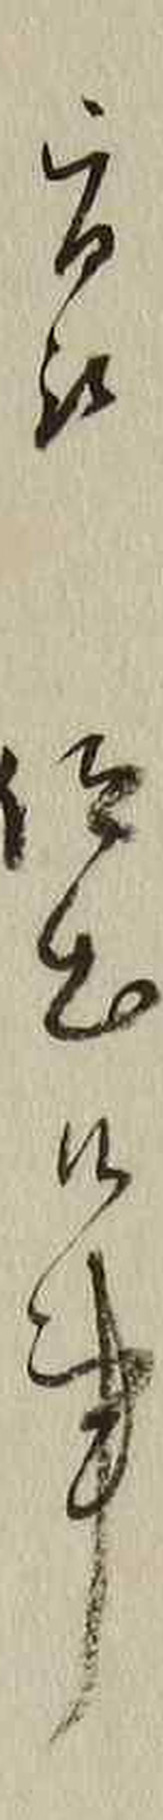旨被仰出候事
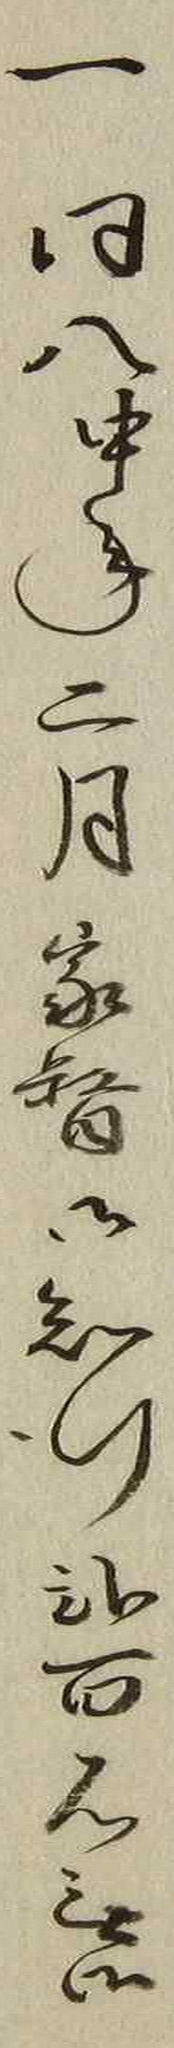一同八申年二月家督御知行弐百石無御
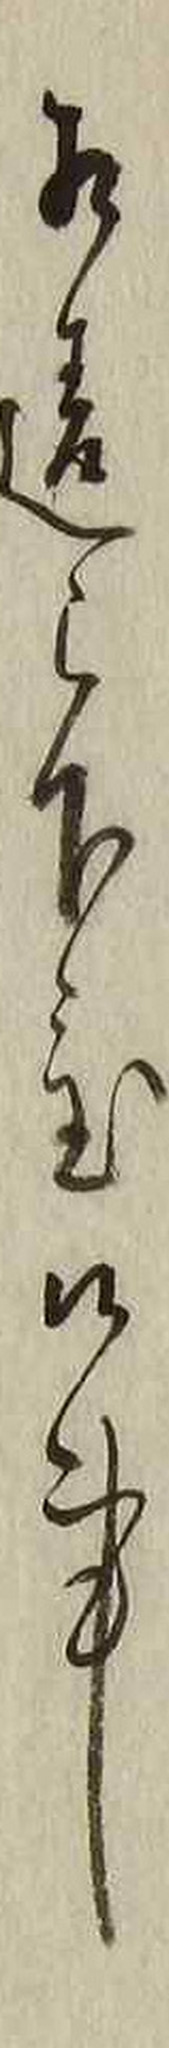相違被下置候事
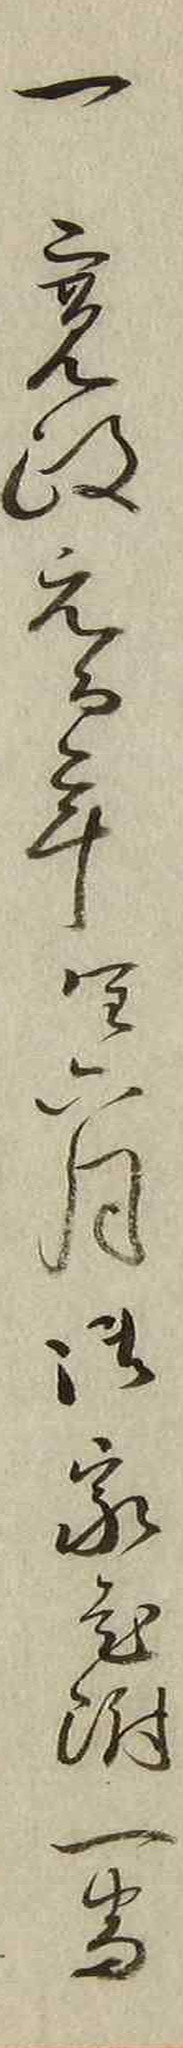一寛政元酉年閏六月御家老附一番
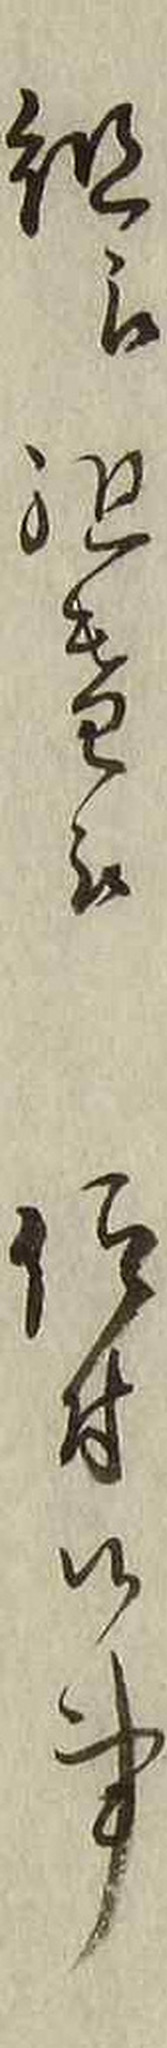組江組替被仰付候事
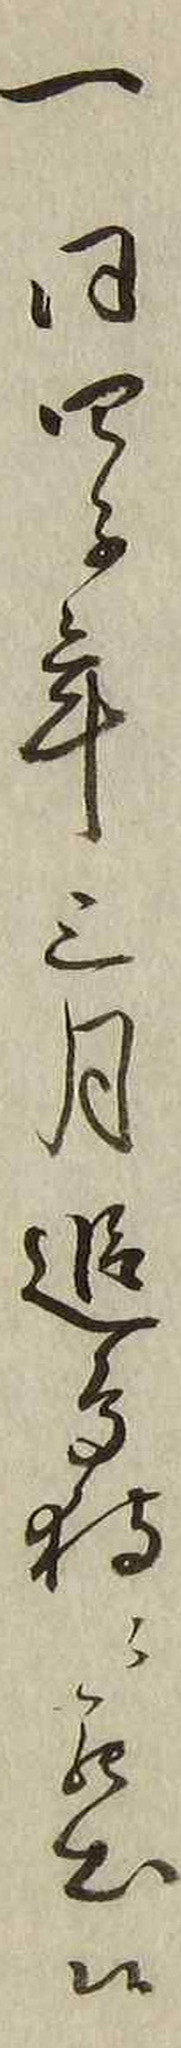一同四子年三月追鳥狩に罷出候
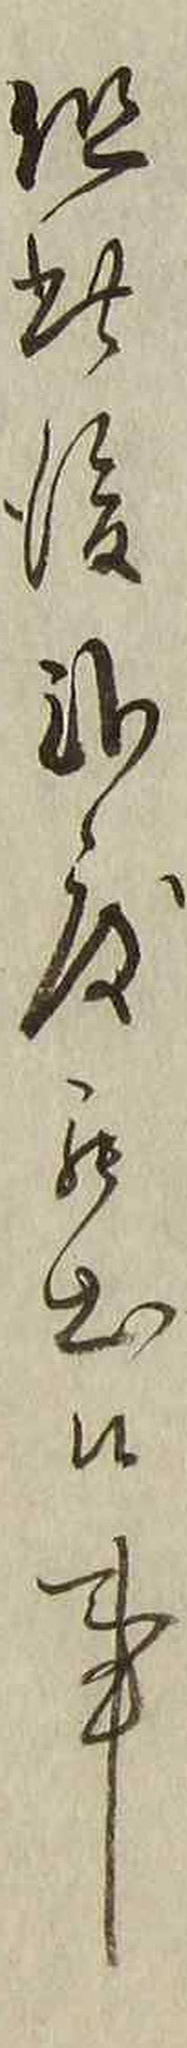但此後弐度罷出候事
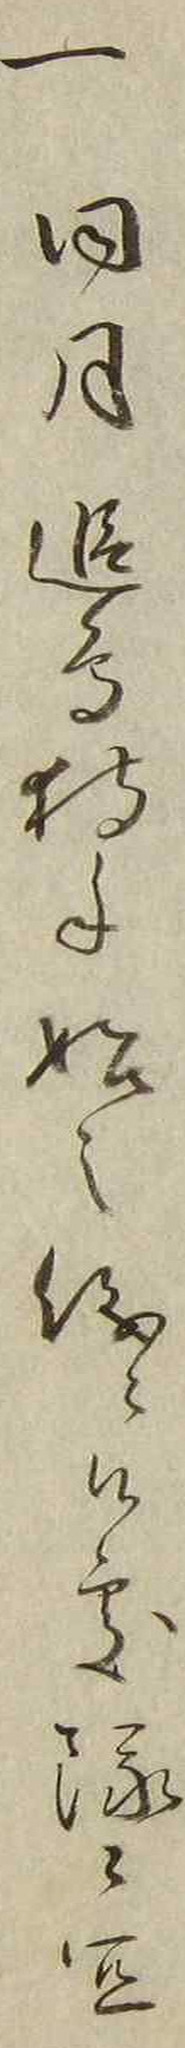一同月追鳥狩手始之儀に候処隊々宜
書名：諸士系譜　巻之3　い之部3
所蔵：会津若松市立会津図書館
